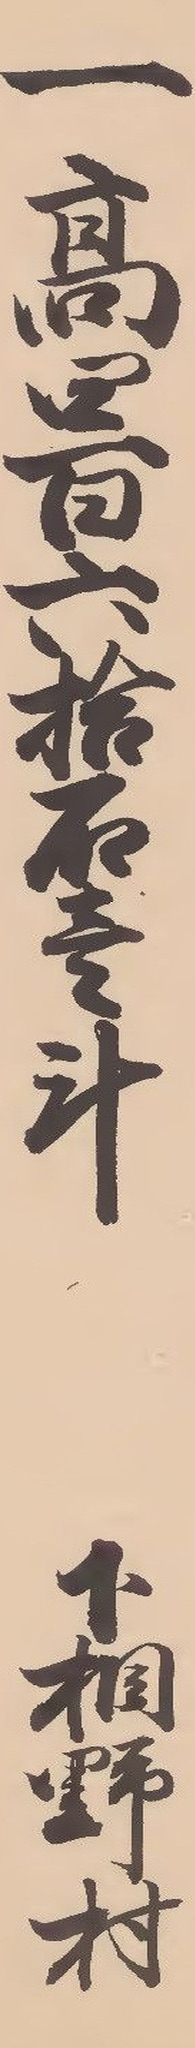一高四百六拾石壱斗下相野村
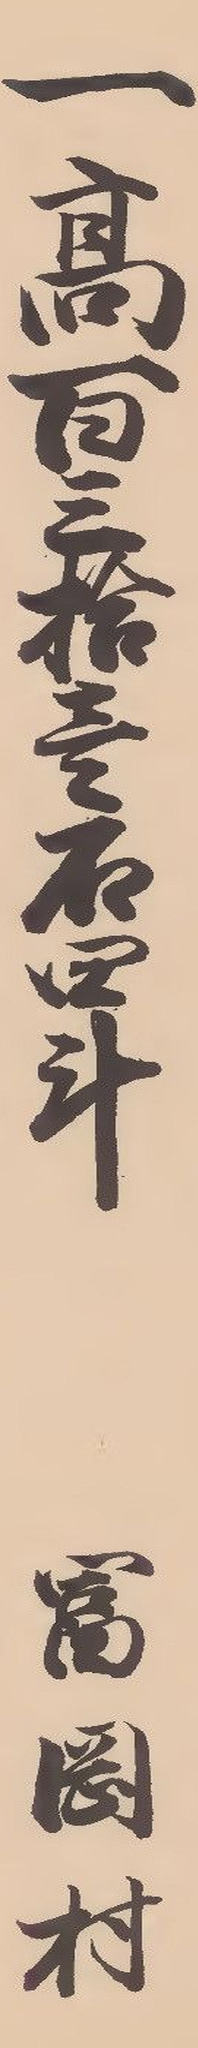一高百三拾壱石四斗富岡村
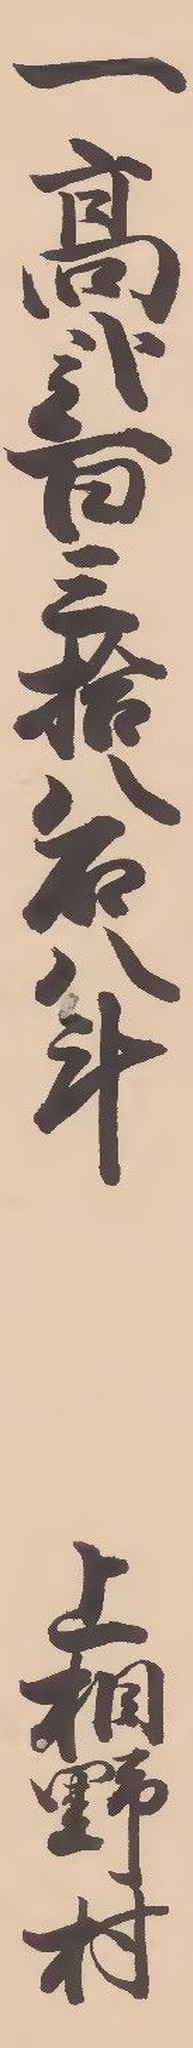一高弐百三拾八石八斗上相野村
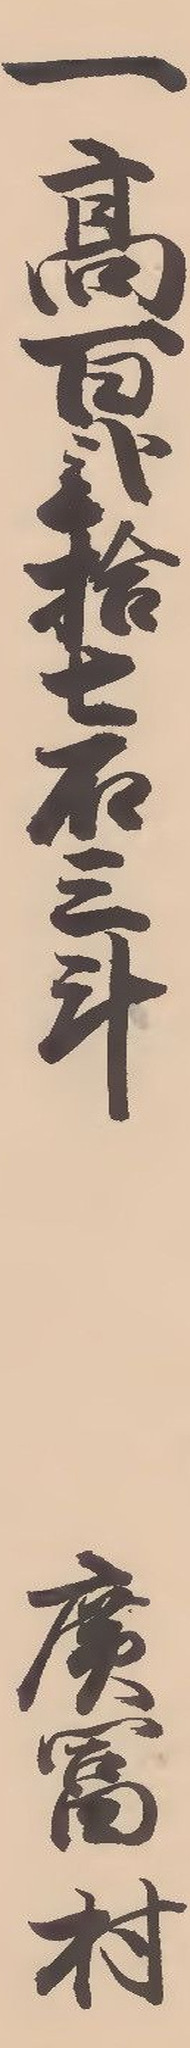一高百弐拾七石三斗広富村
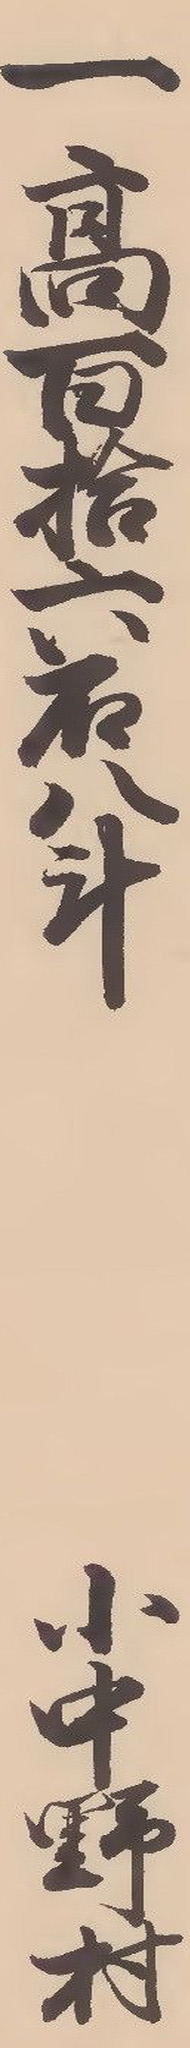一高百拾六石八斗小中野村
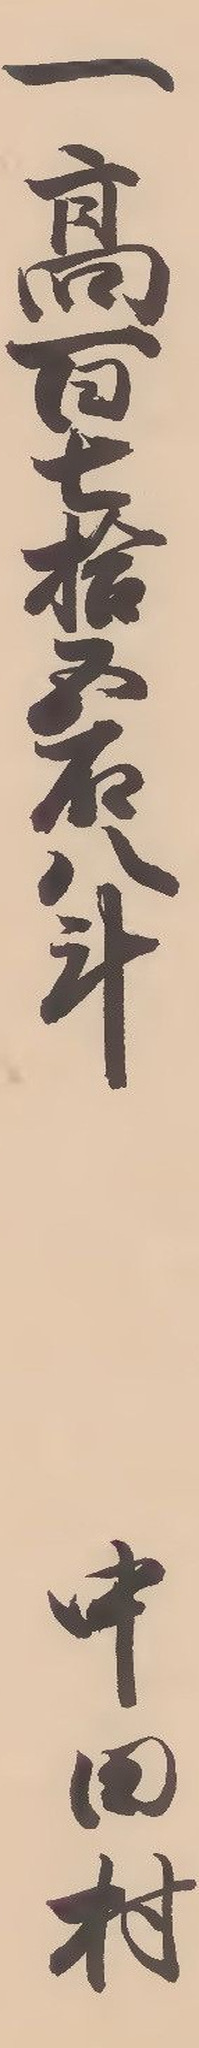一高百七拾五石八斗中田村

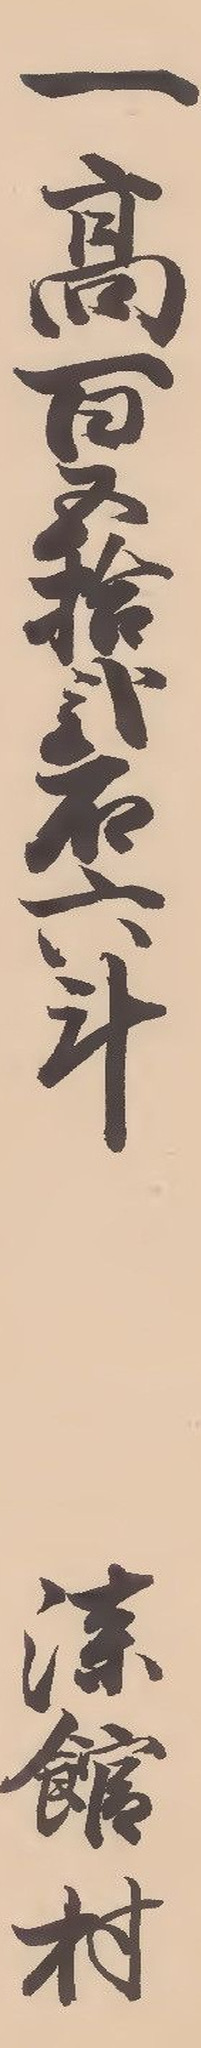一高百五拾弐石六斗漆館村
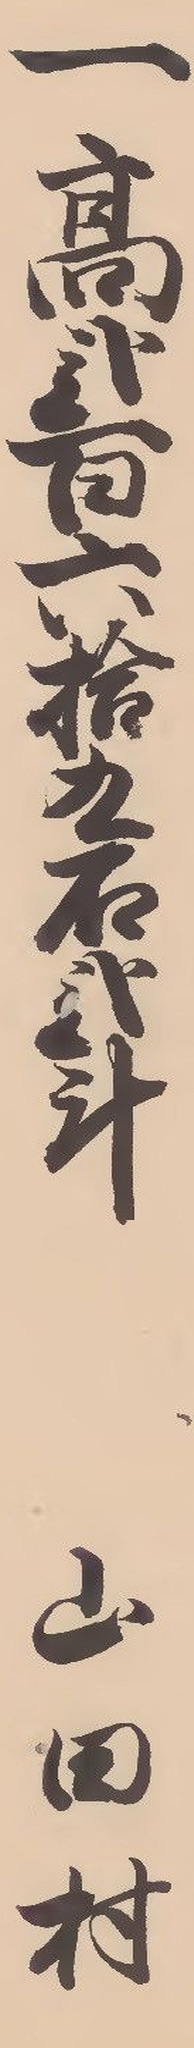一高弐百六拾九石弐斗山田村
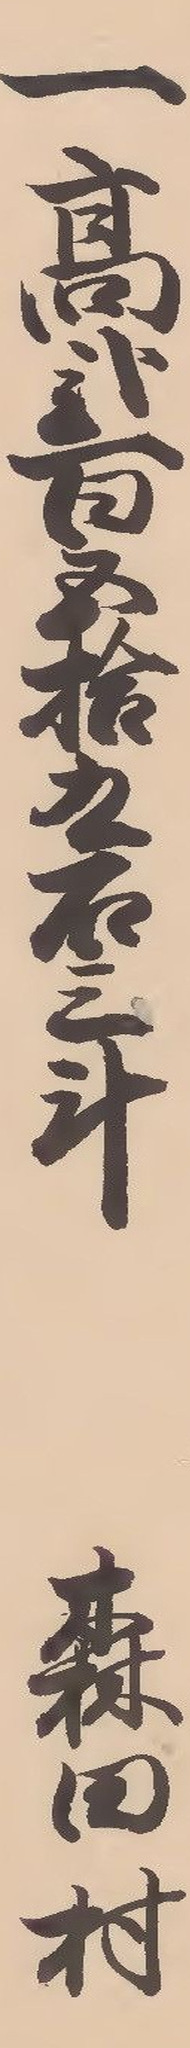一高弐百五拾九石三斗森田村
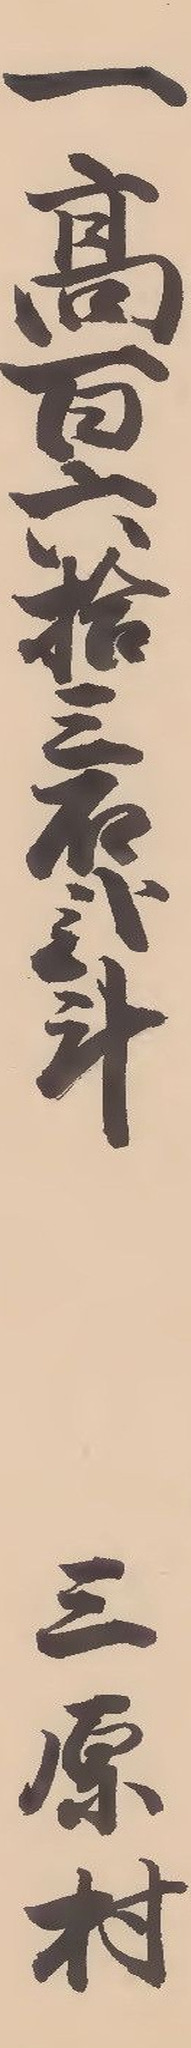一高百六拾三石弐斗三原村
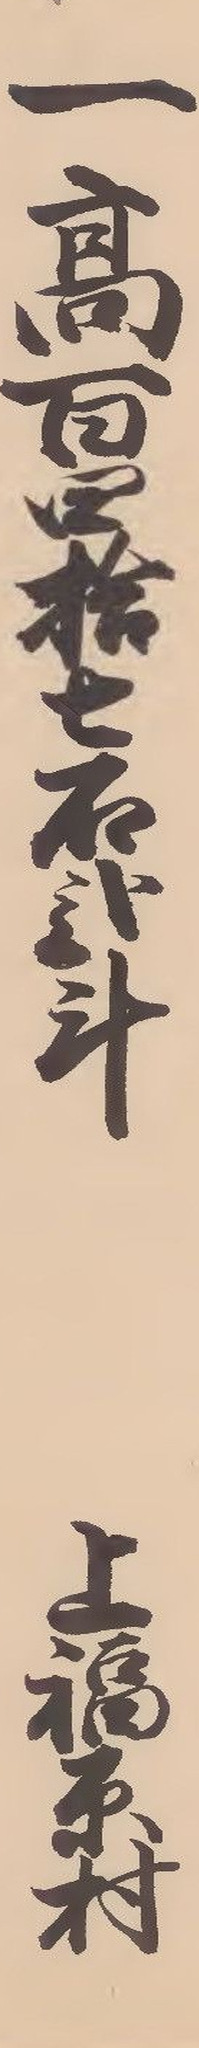一高百四拾七石弐斗上福原村
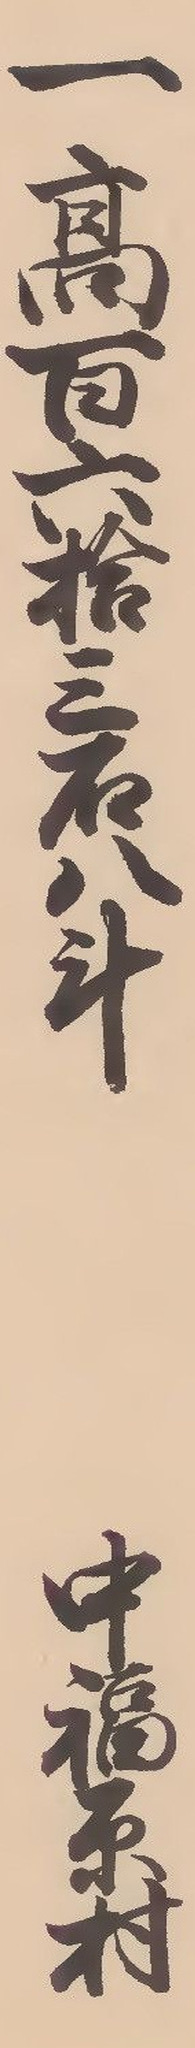一高百六拾三石八斗中福原村

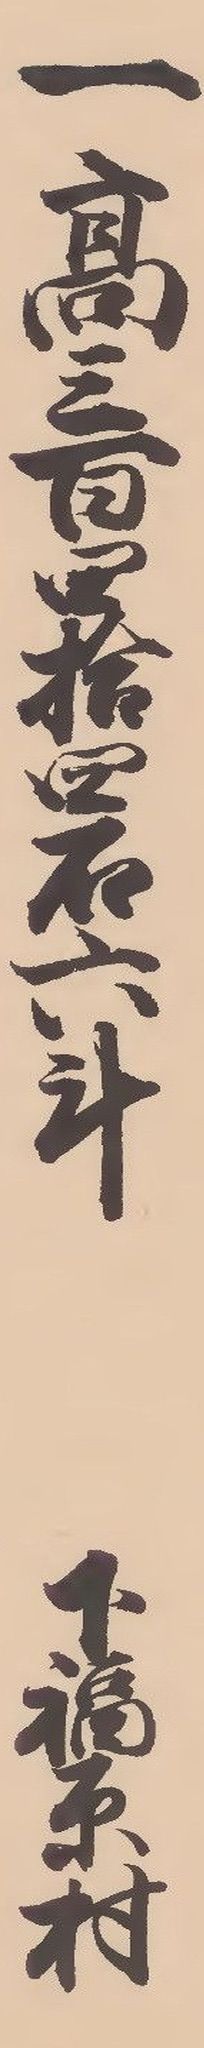一高三百四拾四石六斗下福原村
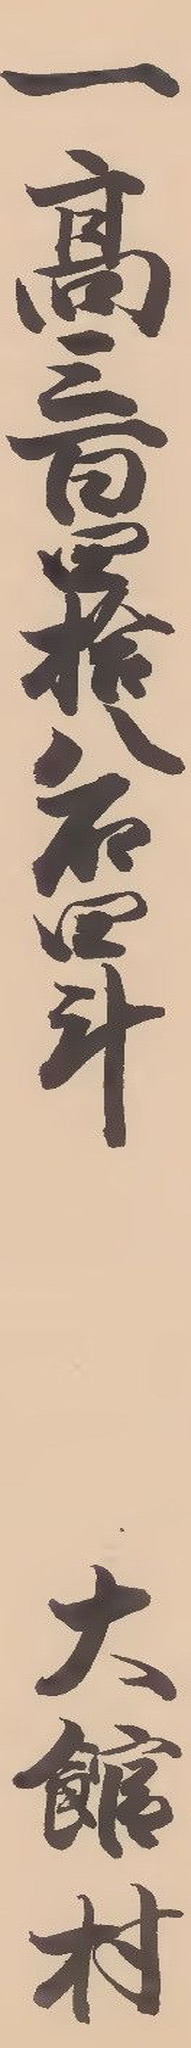一高三百四拾八石四斗大館村
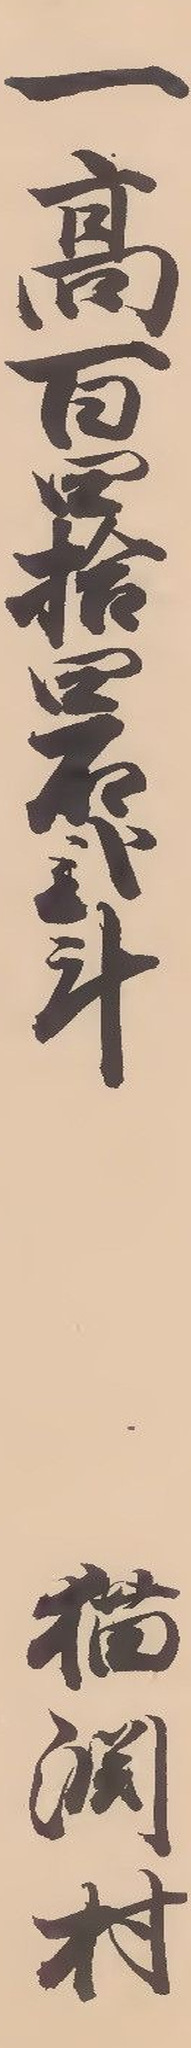一高百四拾四石弐斗猫淵村
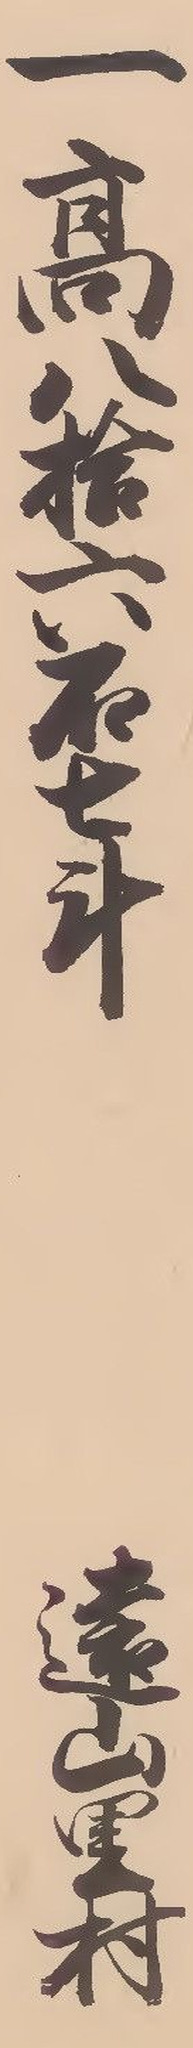一高八拾六石七斗遠山里村
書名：陸奥国郷帳　７
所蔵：国立公文書館 National Archives of Japan
